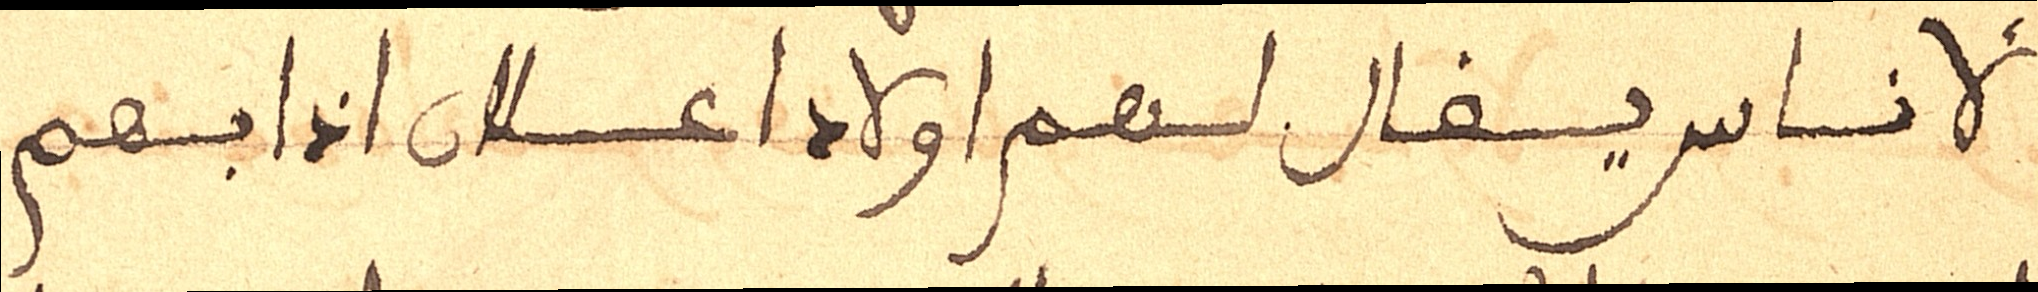لا ناس يقال لهم اولاد اعلان اذا بهم
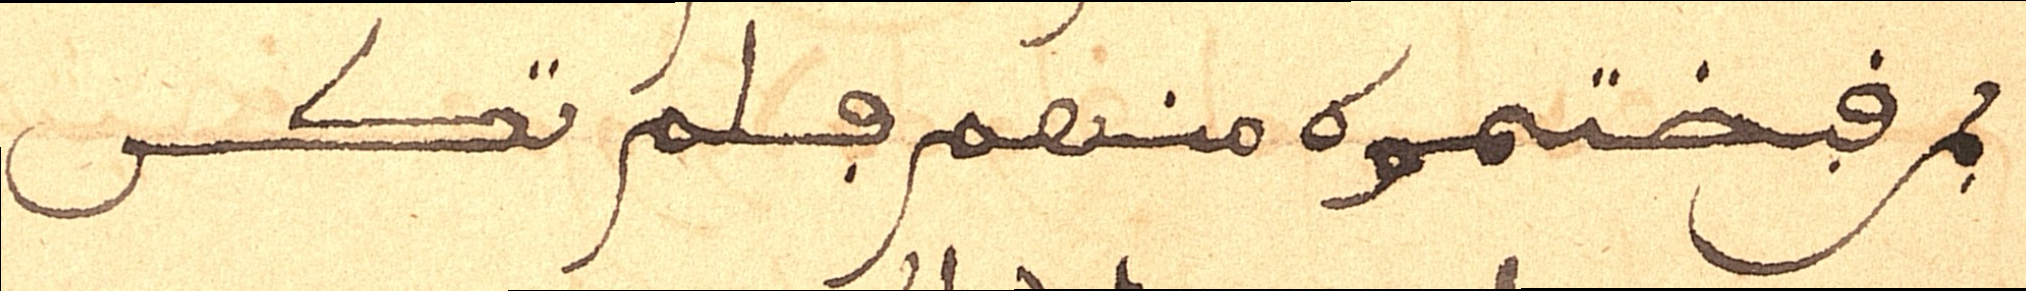بمن قبضتموه منهم فلم تكن
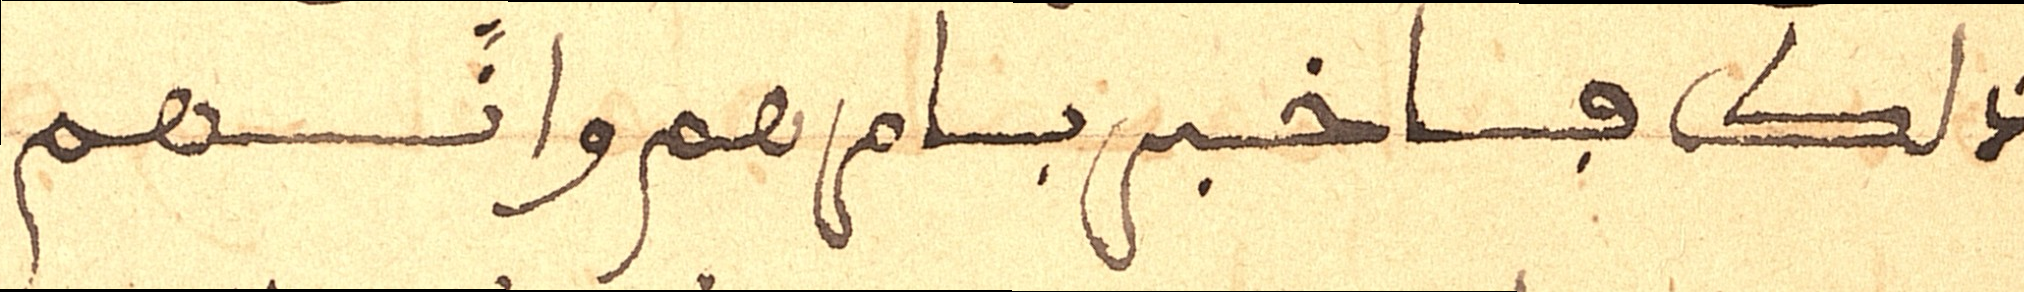ذلك فاخبر بامرهم وانهم
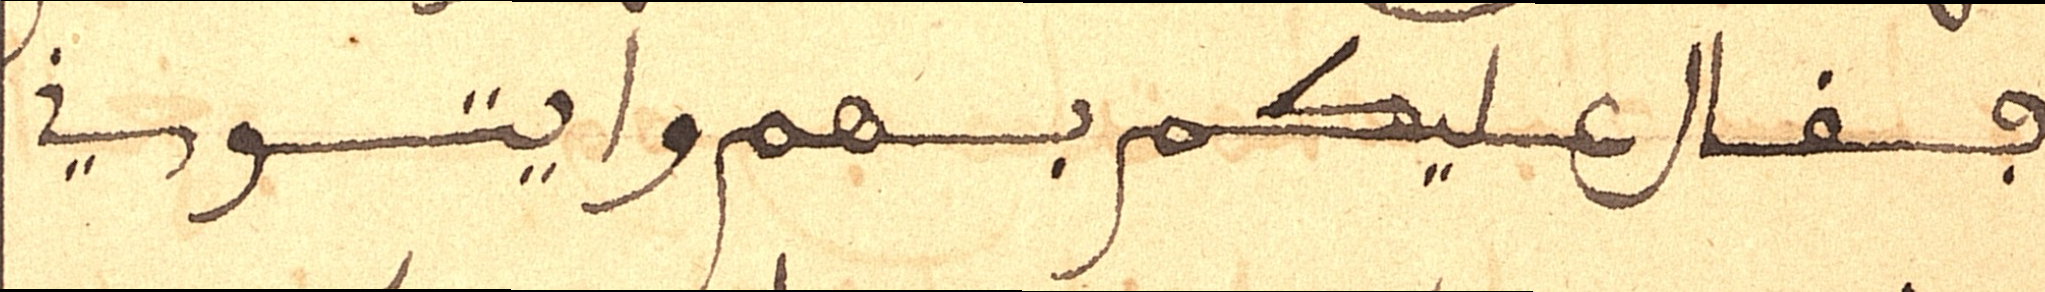فقال عليكم بم وايتوني
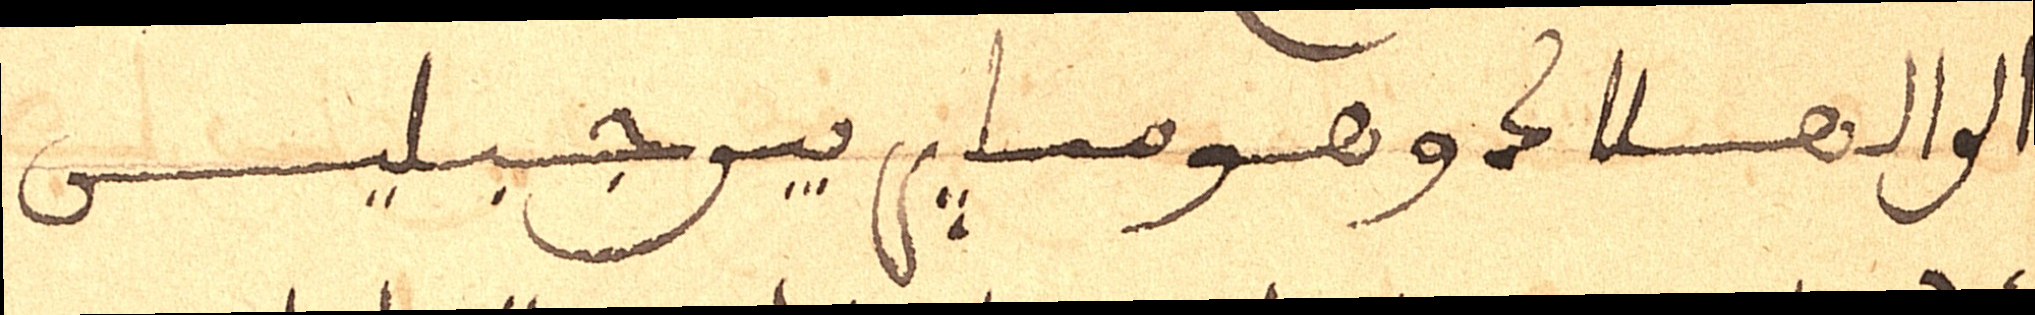الى الهلاك وهو مائر بين جبلين
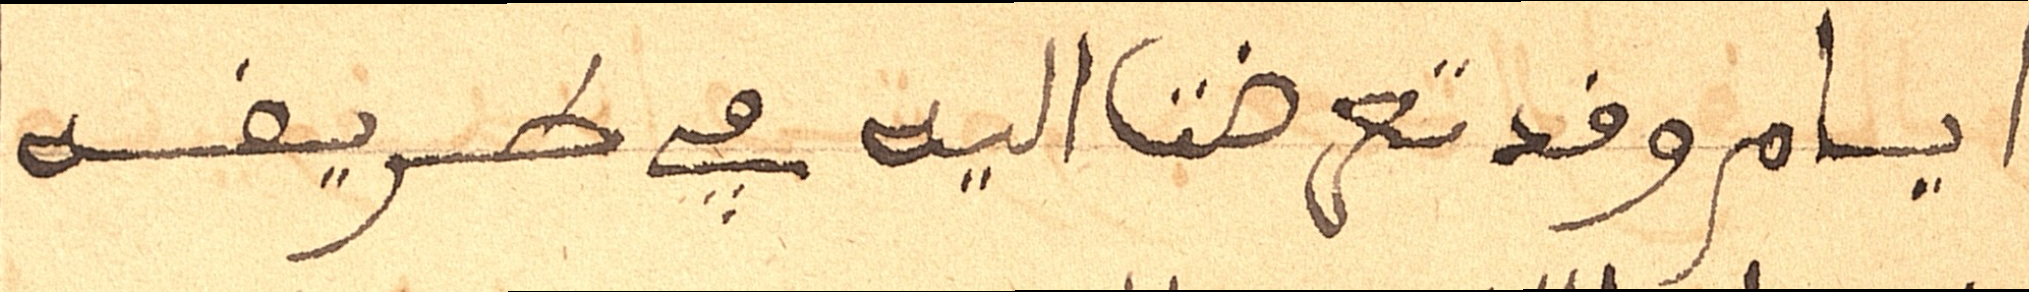ايام وقد تعرضت اليه في طريقه
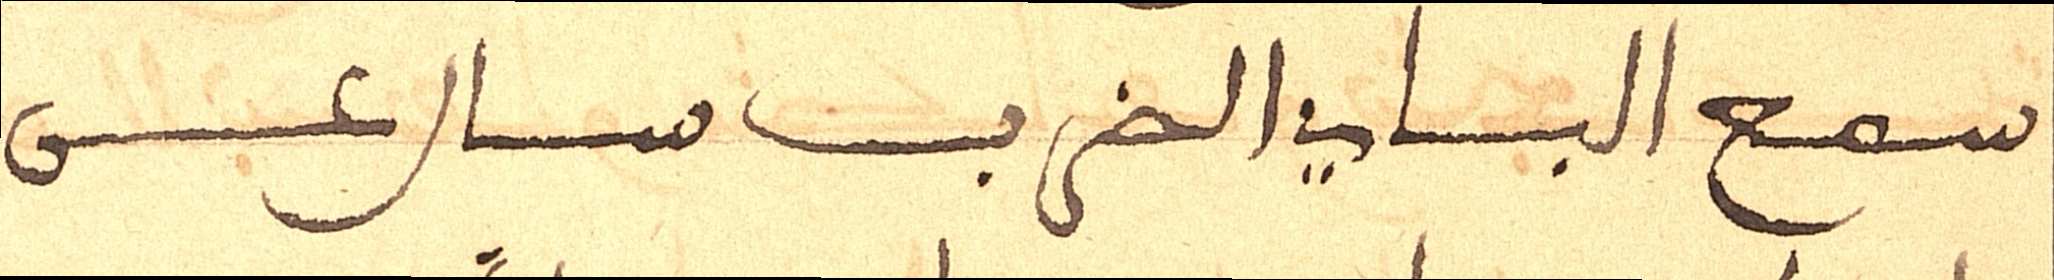سمع الباي الضرب سال عن
